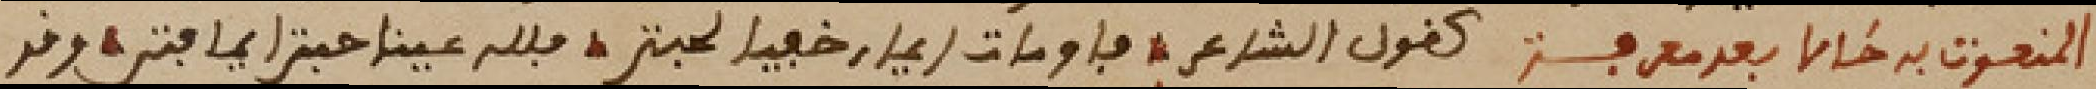المنعوت به حالا بعدم معرفة كقول الشاعر فاومات ايما خفيا لحبتر فلله عينا حبتر ايما فتى وقد
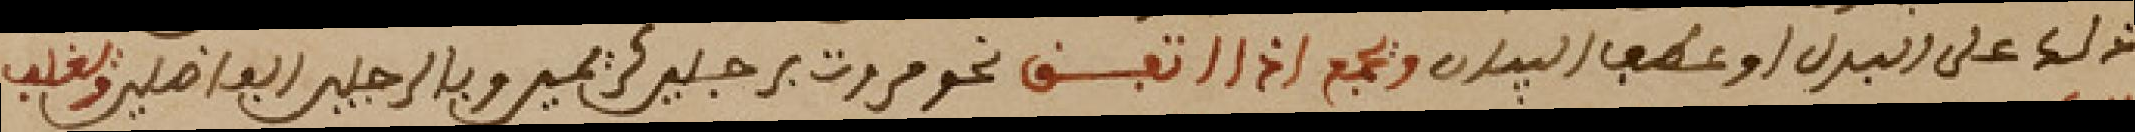ذلك على البدل او عطف البيان ويجمع اذا اتفق نحو مررت برجلين كريمين وبالرجلين الفاضلين ويغلب
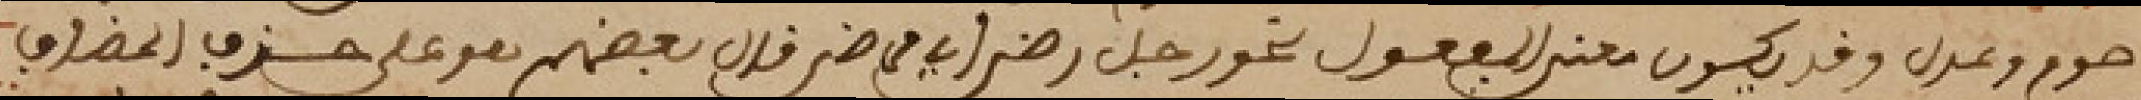صوم وعدل وقد يكون معنى المفعول نحو رجل رضى اي مرضى قال بعضهم هو على حذف المضاف
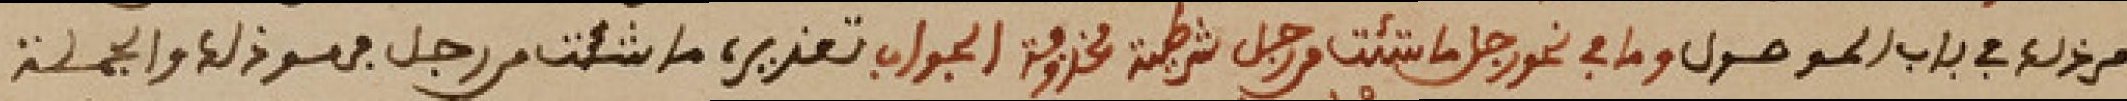مر ذلك في باب الموصول وما في نحو رجل ما شئت من رجل شرطية محذوفة الجواب تقديره ما شئت من رجل فهو ذلك والجملة
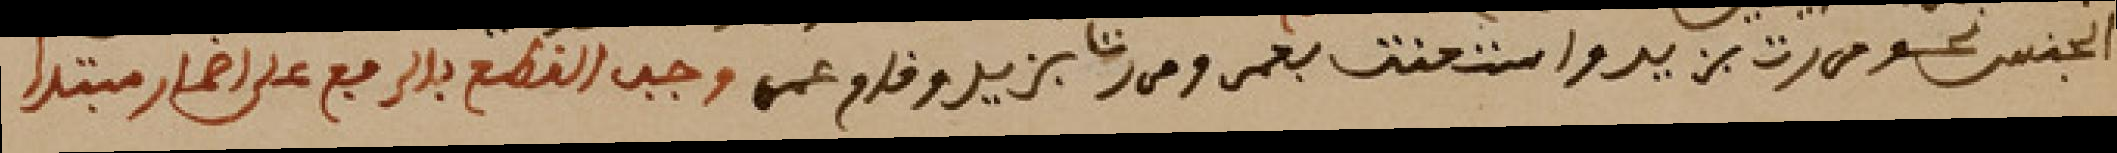الجنس نحو مررت بزيد واستعنت بعمر ومررت بزيد وقام عمر وجب القطع بالرفع على اضمار مبتدا
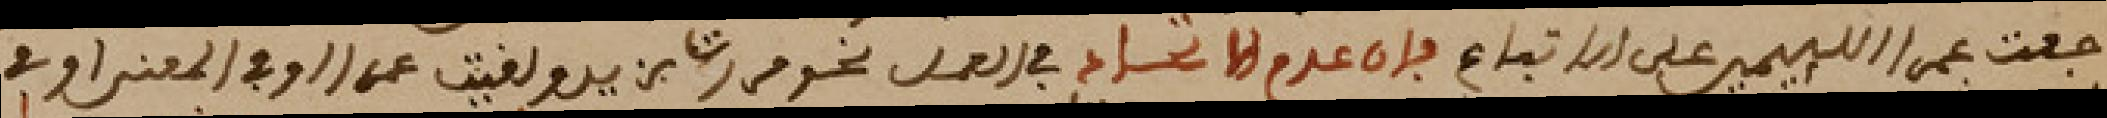جعت عمرا اللئيمين على الاتباع فان عدم الاتحاد في العمل نحو مررت بزيد ولقيت عمرا او في المعنى اوفي
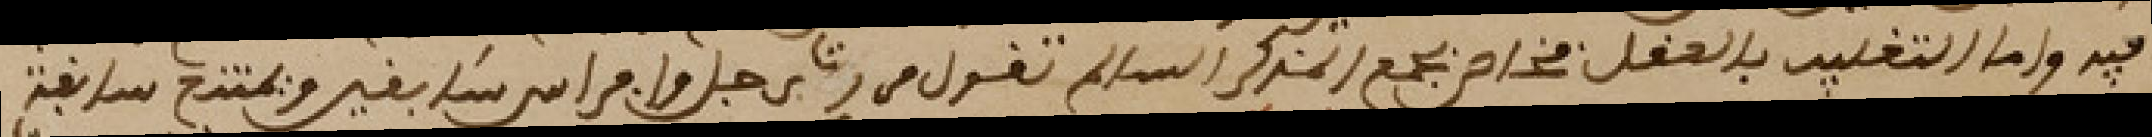فيه واما التغليب بالعقل فخاص بجمع المذكر السالم تقول مررت برجل وافراس سابقين ويمتنع سابقة
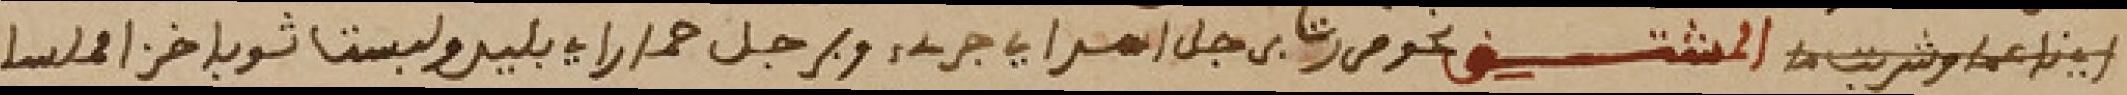المشتق نحو مررت برجل امر أي جرىء وبرجل حمار اي بلين ولبست ثوبا خزا مملسا
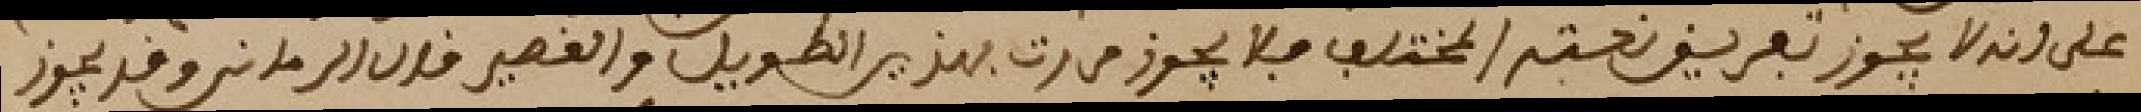على انه لا يجوز تفريق نعته المختلف فلا يجوز مررت بهذين الطويل والقصير قال الرمانى وقد يجوز
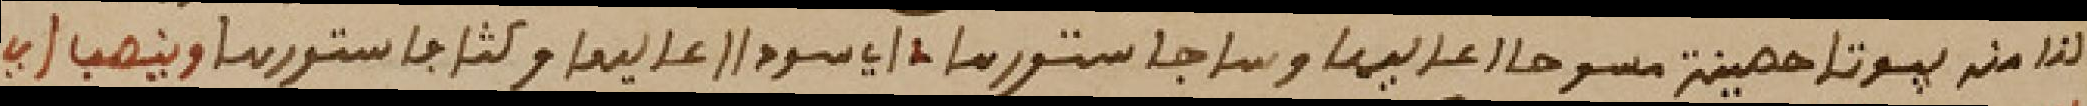لذا منه بيوتا حصينة مسوحا اعاليها وساجا ستورها اي سودا اعاليها وكثافا ستورها وينصب اي
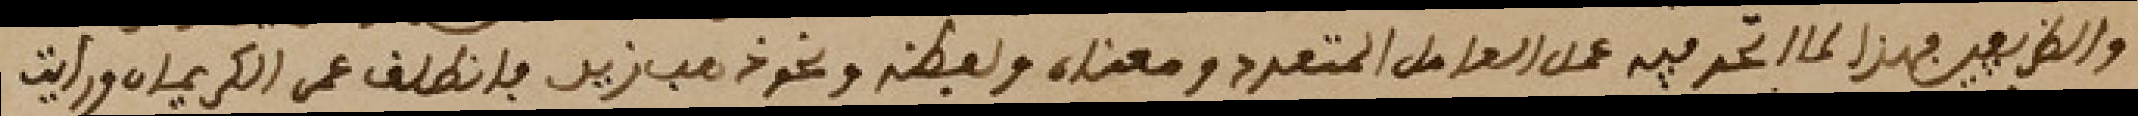والظرفين فهذا لما اتحد فيه عمل العامل المتعدد ومعناه ولفظه ونحو ذهب زيد فانطلق عمر الكريمان ورأيت
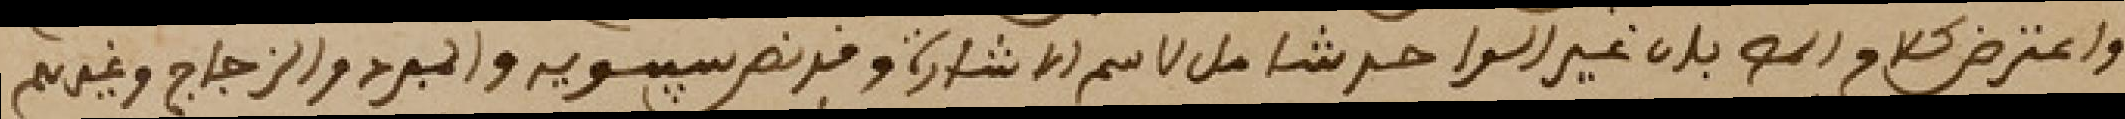واعترض كلام المصه بان غير الواحد شامل لاسم الاشارة وقد سيبويه والمبرد والزجاج وغيرهم
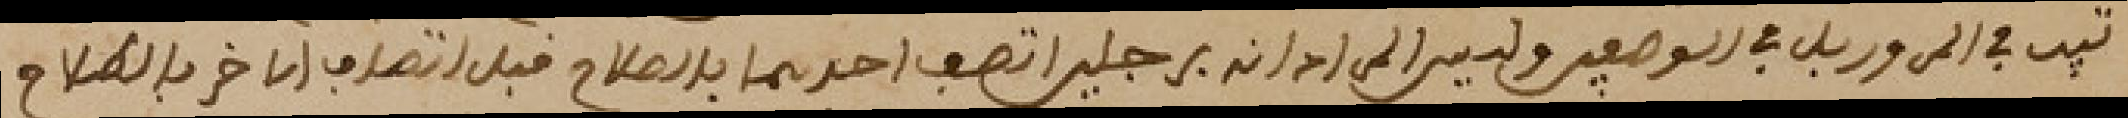تيب في المردود بل في الوصفين وليس المراد انه برجلين اتصف احدهما بالصلاح قبل اتصاف الاخر بالطالح
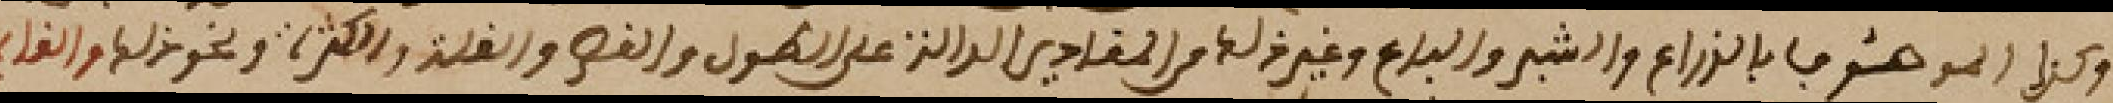وكذا الموصوف بالزراع والشبر والباع وغير ذلك من المقادير الدالة على الطول والقصر والقلة والكثرة ونحو ذلك والقائم
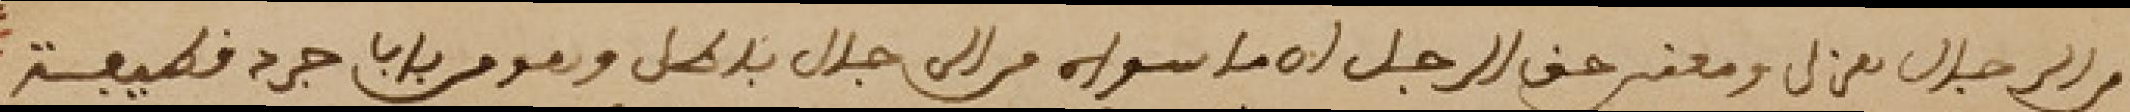من الرجال هزل معنى حق الرجل ان ماسواه من الرجال طابل وهو من باب جرد قطيفة
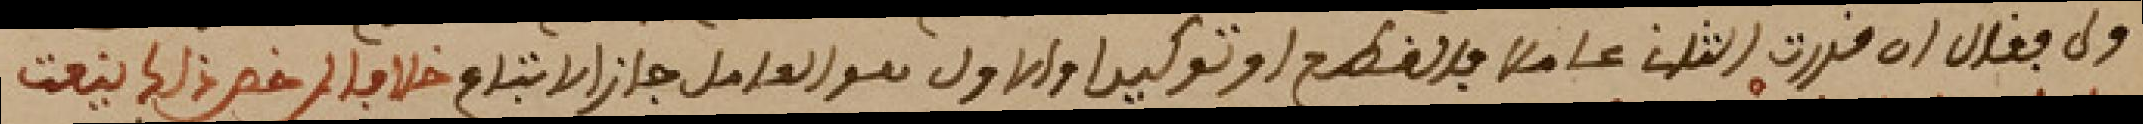ول فقال ان قدرت الثانى عاملا فالقطع او توكيد الاول هو العامل جاز الاتباع خلافا لمن خص ذلك ينعت
